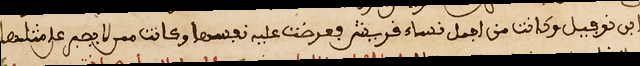ابن نوفيل وكانت من اجمل نساء قريش فعرضت عليه نفسها وكانت ممن لا يصبر على مثلها
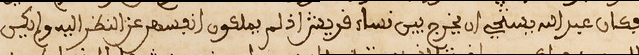فكان عبد الله يستحي ان يخرج بين نساء قريش اذ لم يملكون انفسهم عن النظر اليه ولم يكن
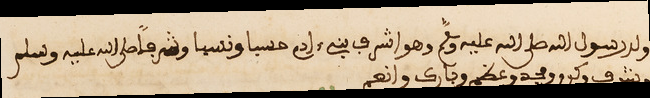ولد رسول الله صلى الله عليه وسلّم وهو اشرف بنى ءادم حسبا ونسبا وشرفا صلى الله عليه وسلم
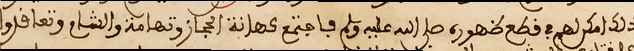ذلك امكن لهم في قطع ظهوره صلى الله عليه وسلم فاجتمع كهانة الحجاز وتهامة والشام وتعاقدوا
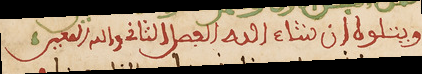ويتلوه ان شاء الله الفصل الثاني والله المعين
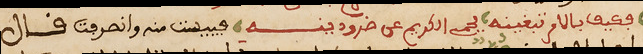فكيف بالامر تبغينه يحمى الكريم عن ضرو دينه فييست منه وانصرفت قال
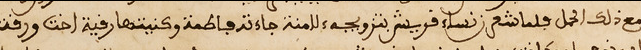مع ذلك الحمل فلما شعرن نساء قريش بتزويجه ءلامنة جاءته فاطمة وكنيتها رقية اخت ورقة
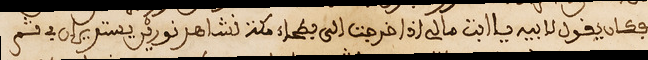فكان يقول لابيه يا ابت ما لى اذا خرجت الى بطحاء مكة نشاهد نورين يستديران بي ثم
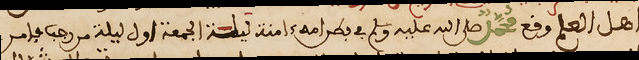اهل العلم وقع محّمد صلى الله عليه وسلم في بطن امه ءامنة ليلة الجمعة اول ليلة من رجب فامر
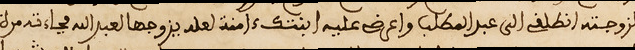لزوجته انطلقى الى عبد المطلب واعرضى عليه ابنتك ءامنة لعله يزوجها لعبد الله فجاءته مرة
